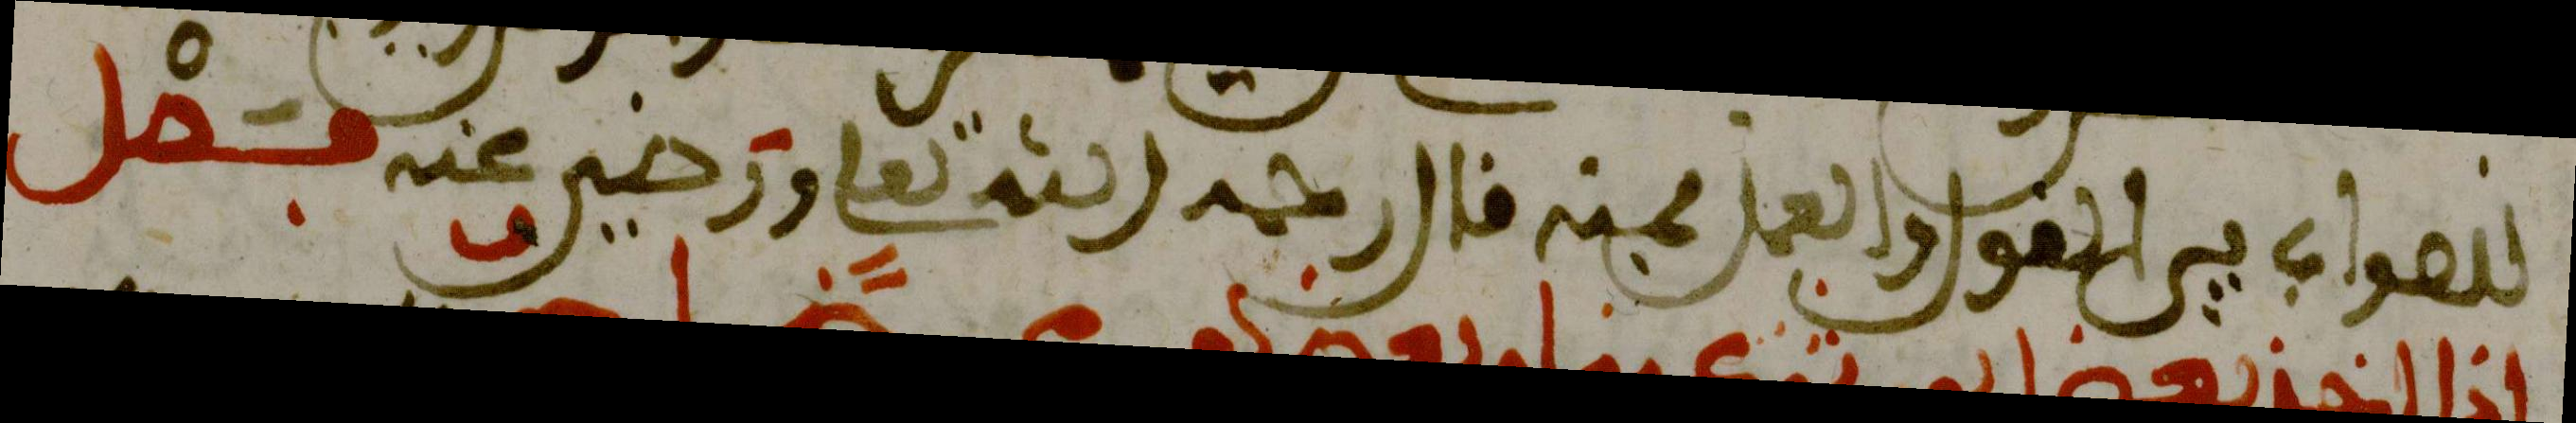للصواب في القول والعمل بمنه قال رحمه الله تعلى ورَضي عنه فَصْل
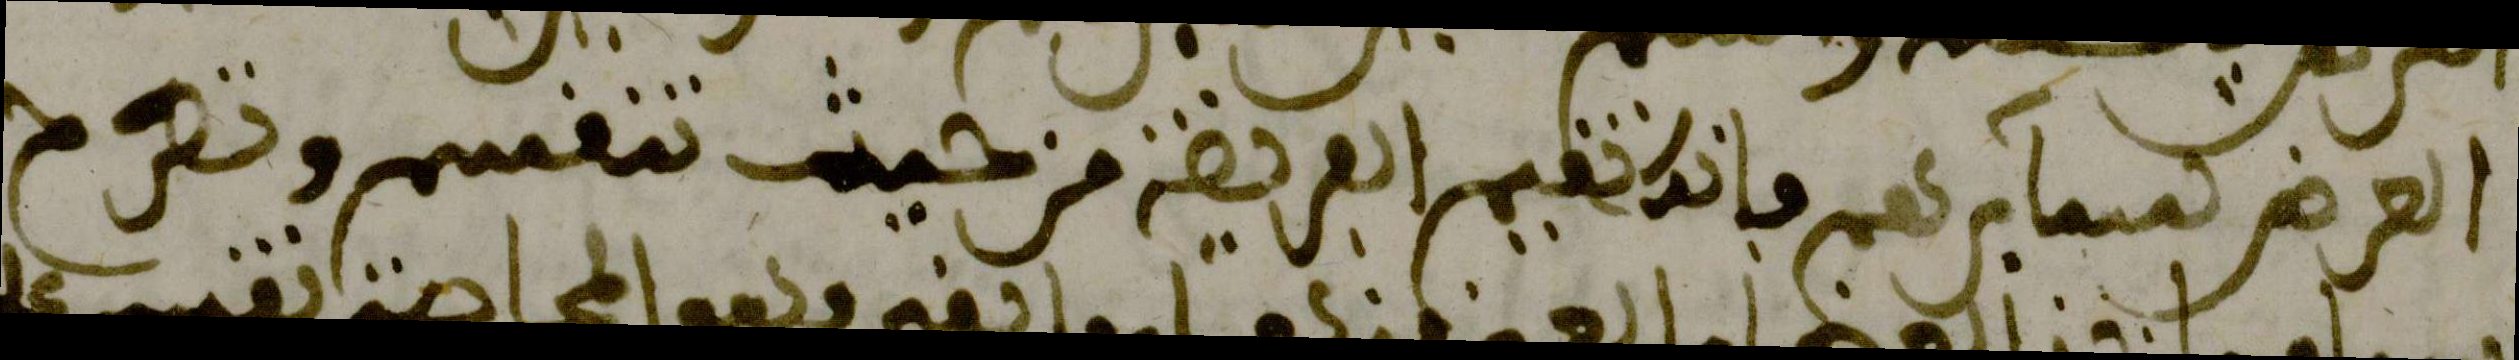العرض لسائرهم فانك تقيم الفريضة من حيث تنقسم وتطرح
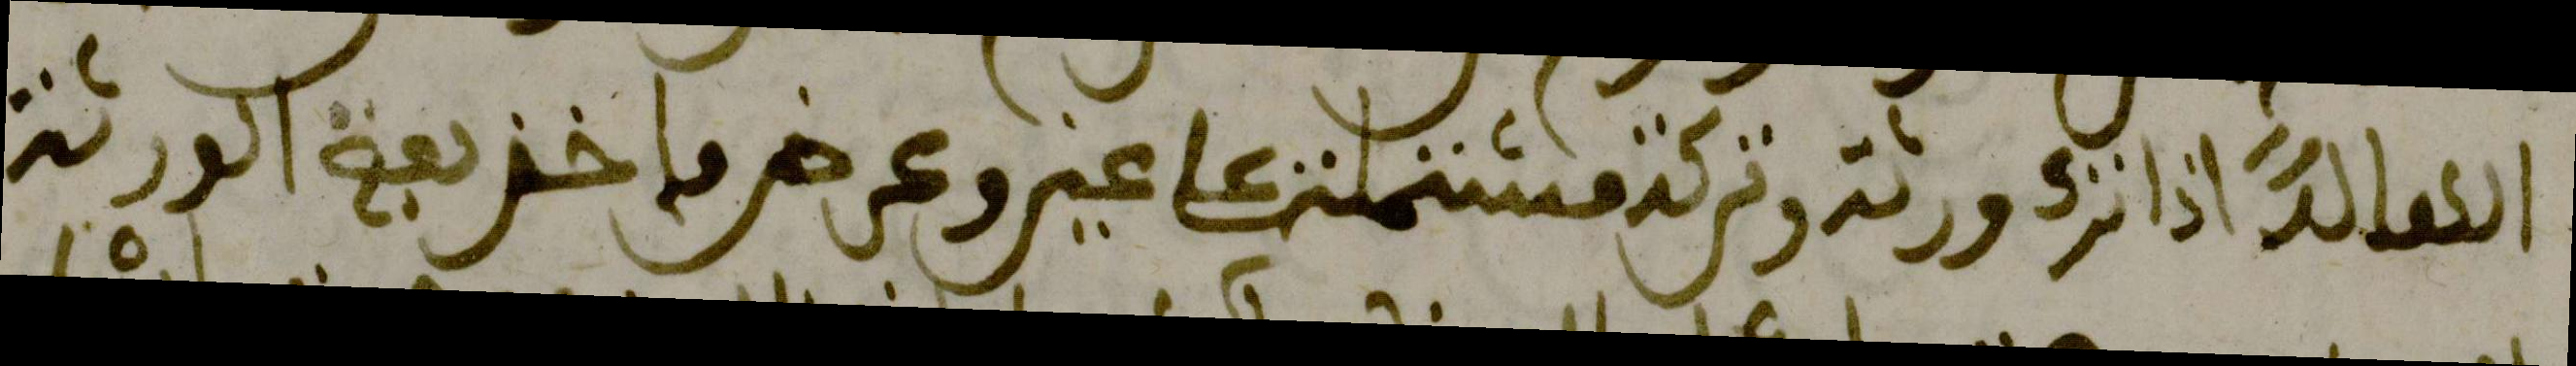الهالك اذا ترك ورثة وتركة مشتملة على عين وعرض فاخذ بعض الورثة
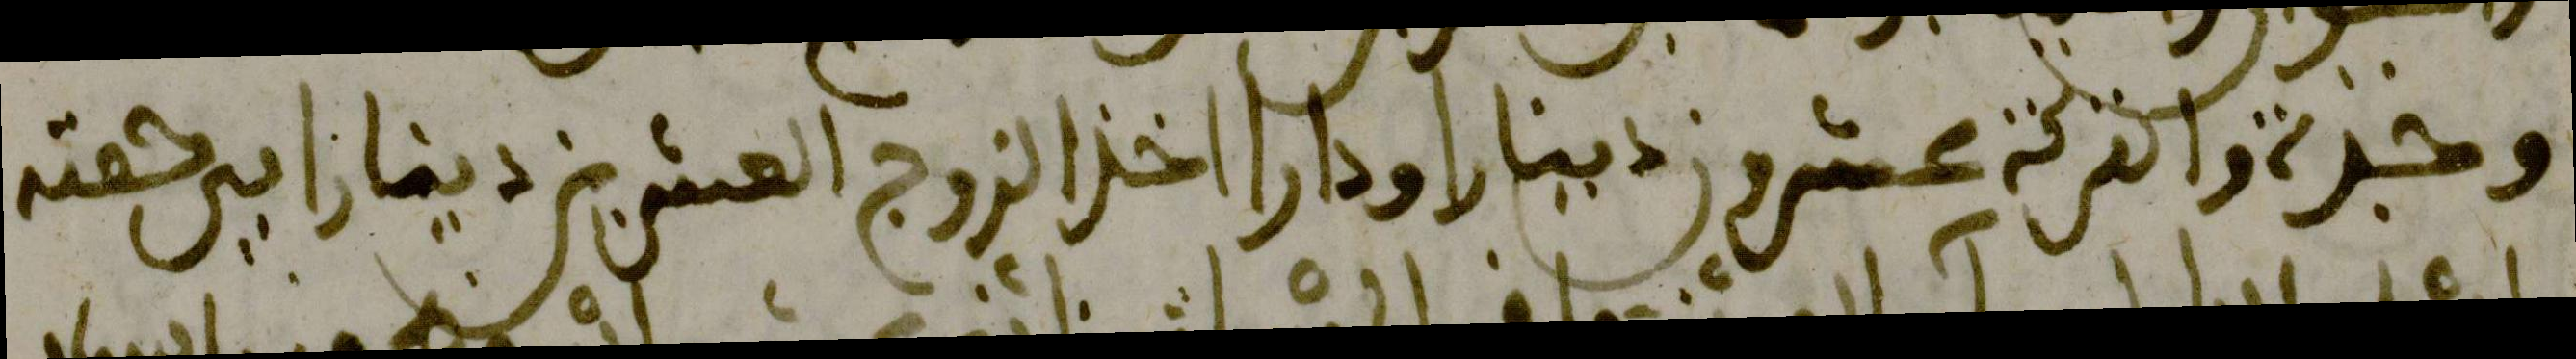وجدة والتركة عشرون دينار او دار اخذ الزوج العشرين دينارا في حصته
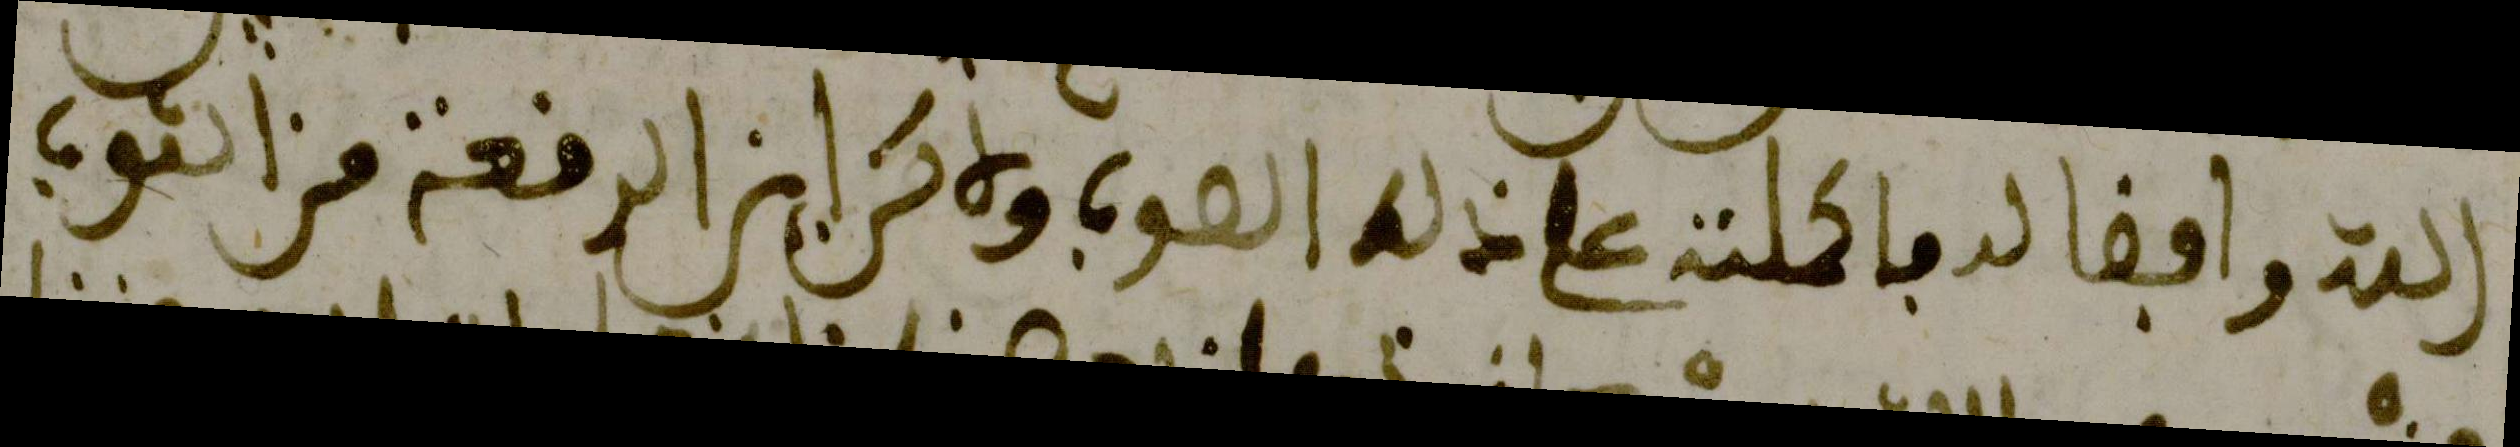الله وافقا له فكملت على ذلك الصوب ولاكن اين الرقعة من الثوب
